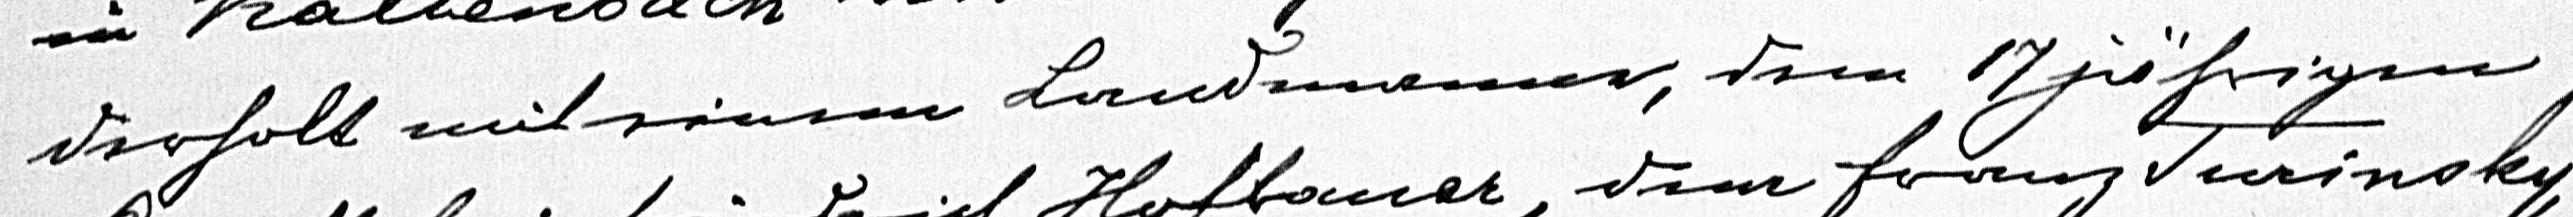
derholt mit einem Landmanne, dem 17jährigen
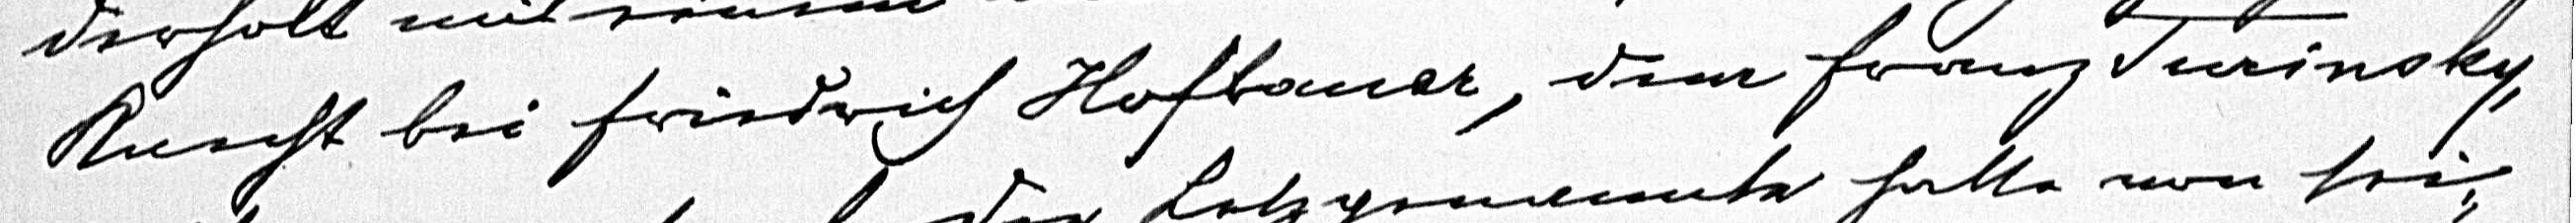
Knecht bei Friedrich Hofbauer, dem Franz Turinsky,
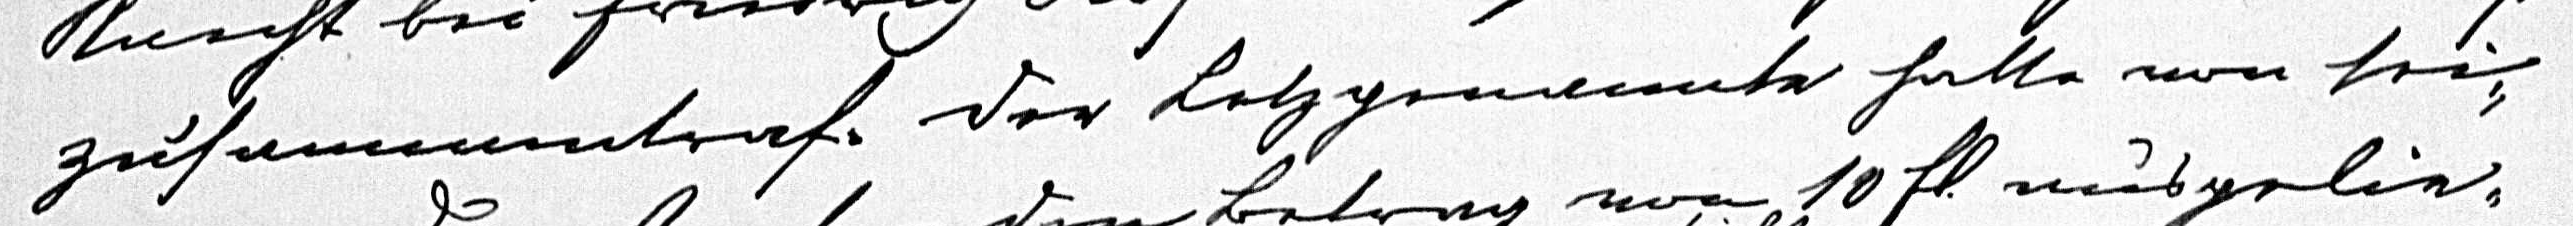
zusammentraf. Der Letztgenannte hatte von sei¬
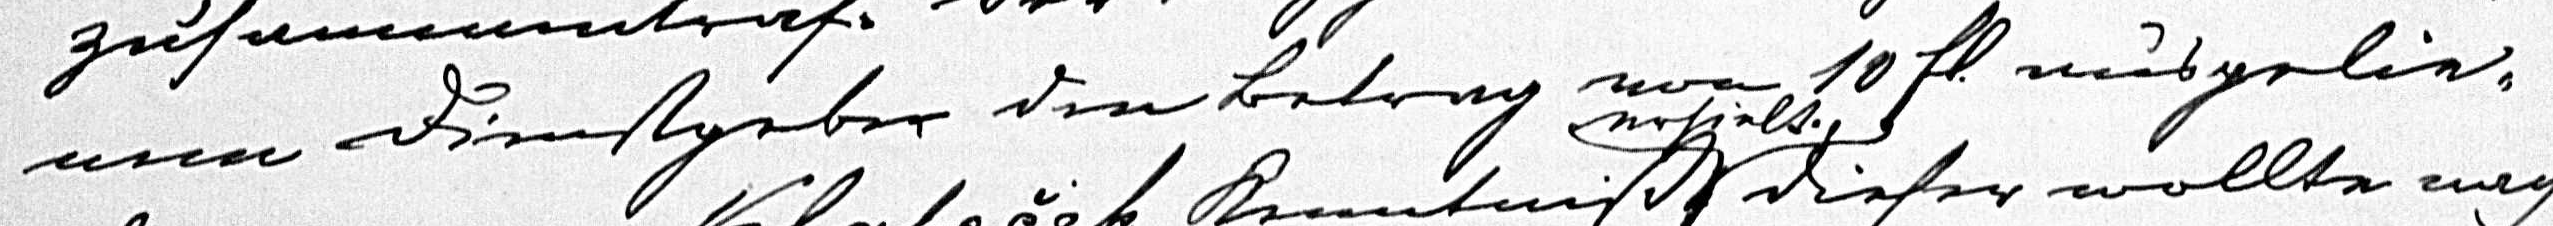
nen Dienstgeber den Betrag von 10 fl. ausgelie¬
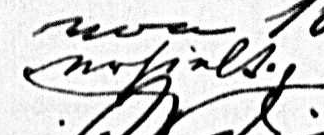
erhielt.
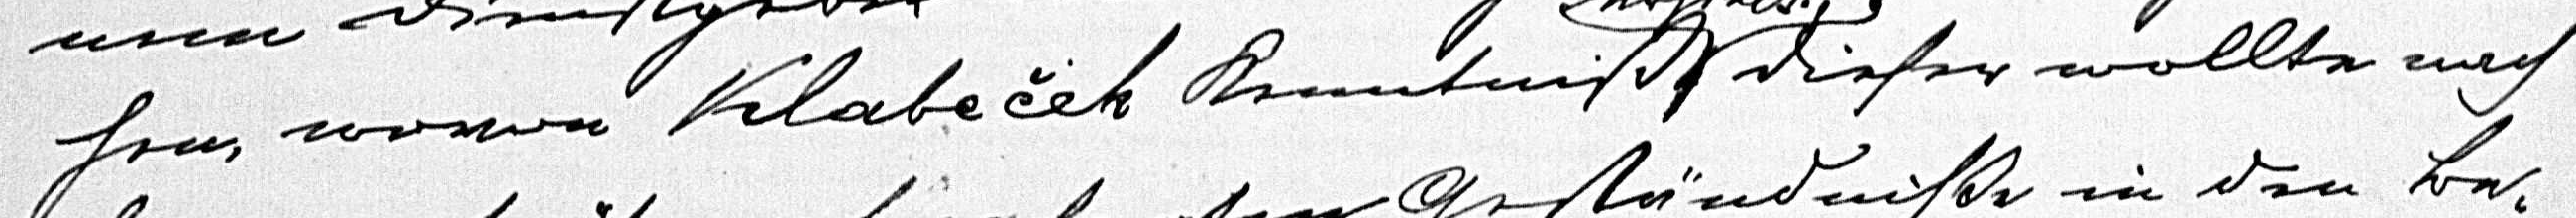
hen, wovon Klabeček Kenntniß Dieser wollte nach
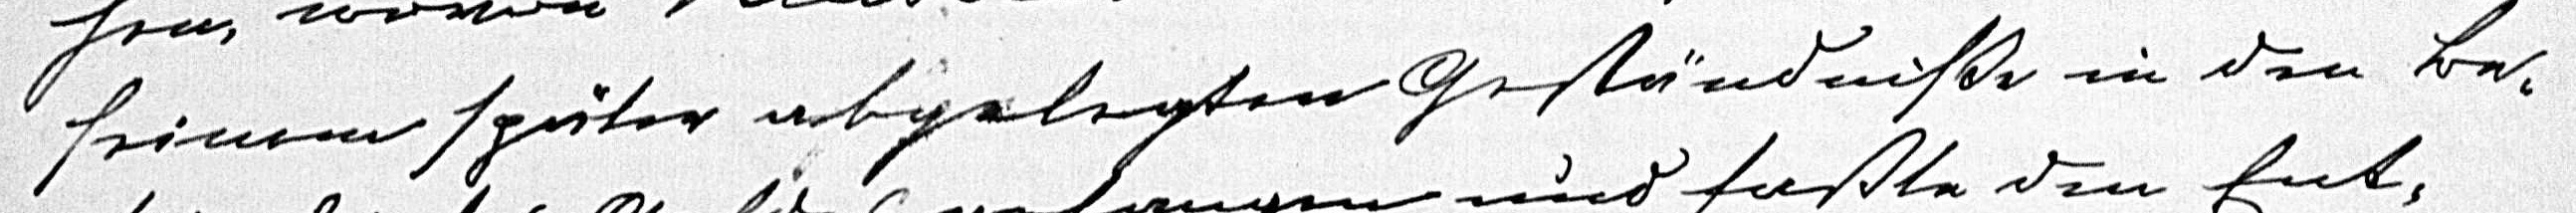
seinem später abgelegten Geständniße in den Be¬
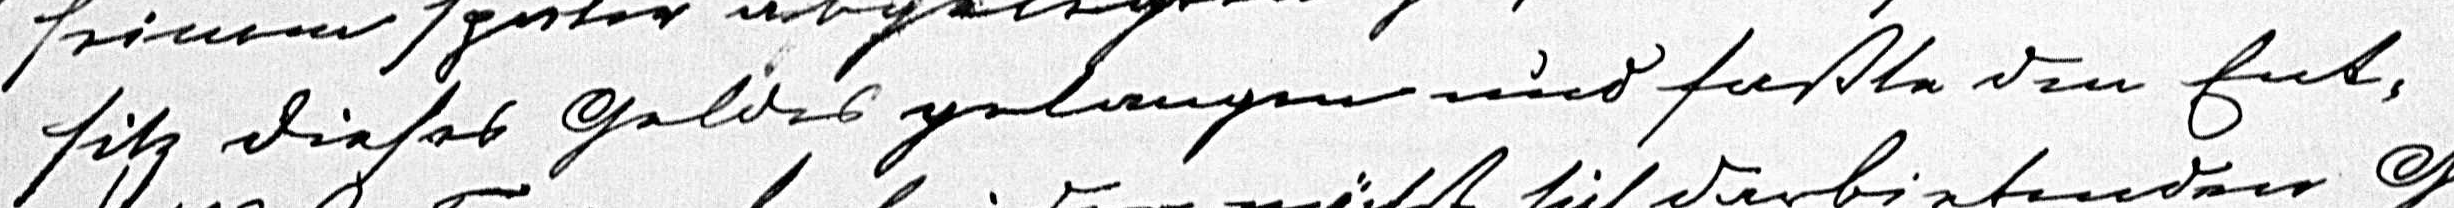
sitz dieses Geldes gelangen und faßte den Ent¬
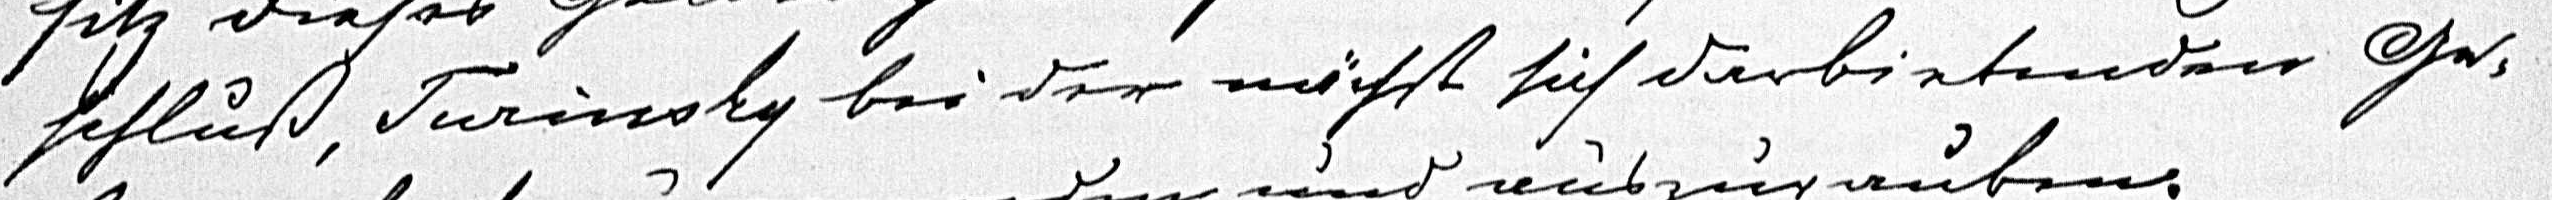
schluß, Turinsky bei der nächst sich darbietenden Ge¬
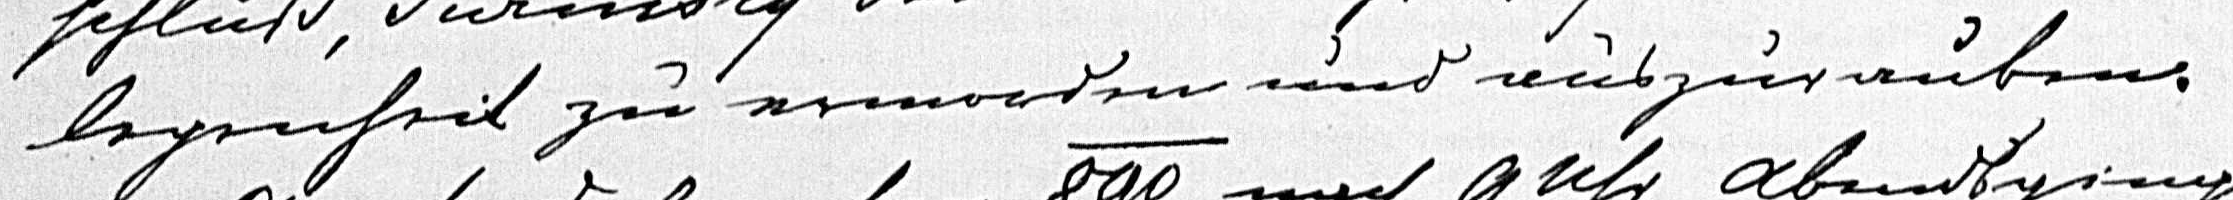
legenheit zu ermorden und auszurauben.
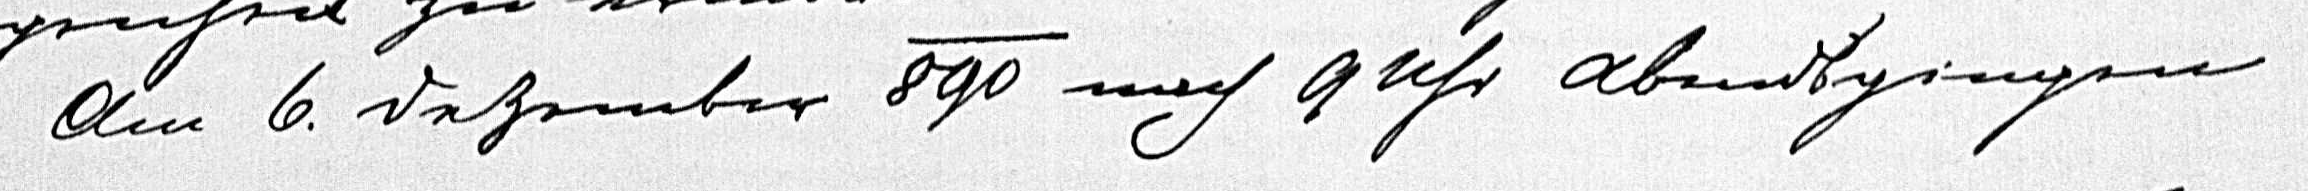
Am 6. Dezember 1890 nach 9 Uhr Abends gingen
